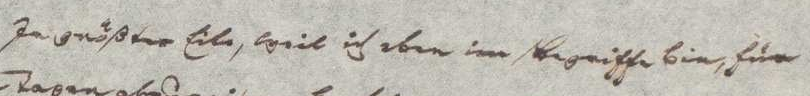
In größter Eile, weil ich eben im Begriffe bin, für
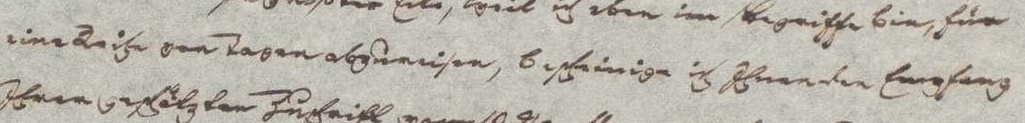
eine Reihe von Tagen abzureisen, bescheinige ich Ihnen den Empfang
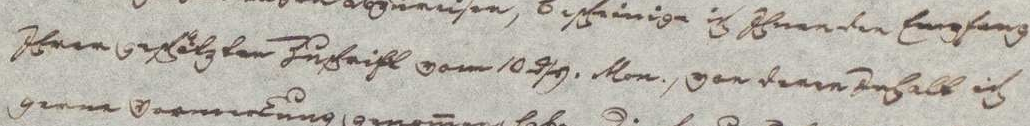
Ihrer geschätzten Zuschrift vom 10 dss. Mon., von deren Inhalt ich
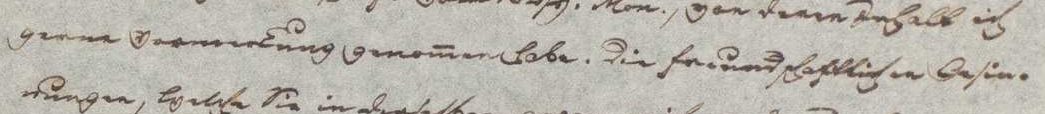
gerne Vormerkung genommen habe. Die freundschaftlichen Gesin-
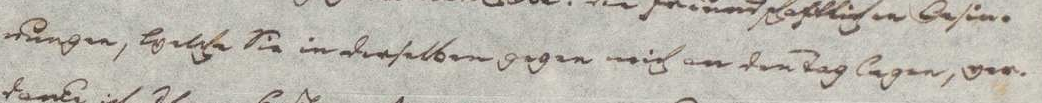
nungen, welche Sie in derselben gegen mich an den Tag legen, ver-
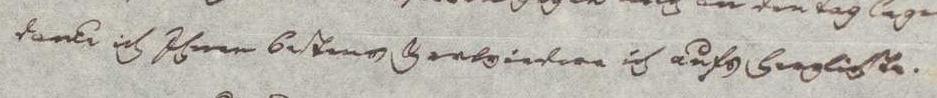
danke ich Ihnen bestens & erwiedere ich aufs herzlichste.
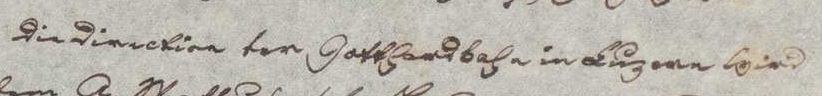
Die Direction der Gotthardbahn in Luzern wird
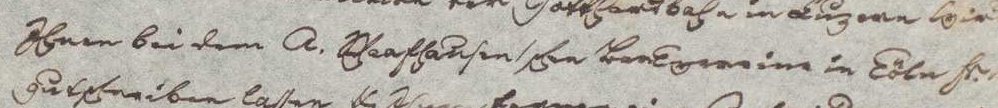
Ihnen bei dem A. Schaafhausen'schen Bankvereine in Cöln fr.
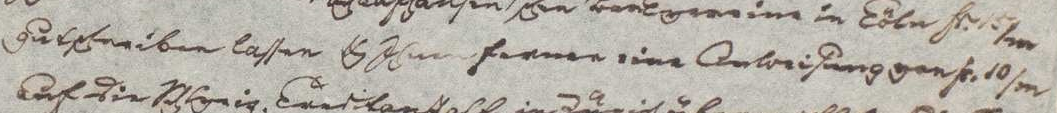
gutschreiben lassen & Ihnen ferner eine Anweisung von Fr. 10/m
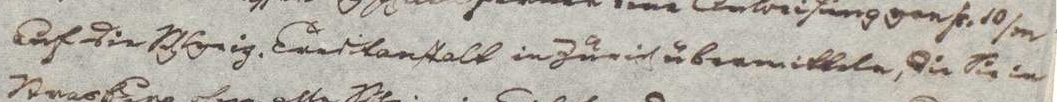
auf die Schweiz. Creditanstalt in Zürich übermitteln, die Sie in
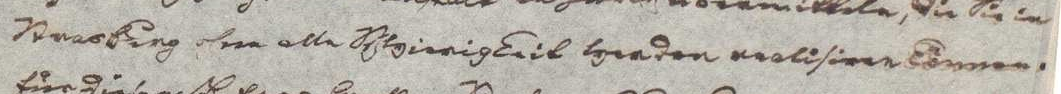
Strasburg ohne alle Schwierigkeit werden realisiren können.
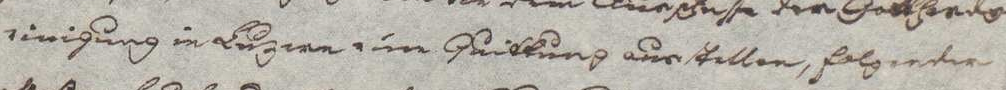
einigung in Luzern eine Quittung ausstellen, folgender
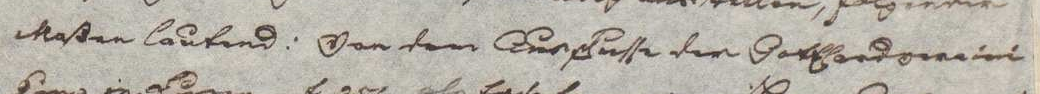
Maßen lautend: Von dem Ausschusse der Gotthardvereini-
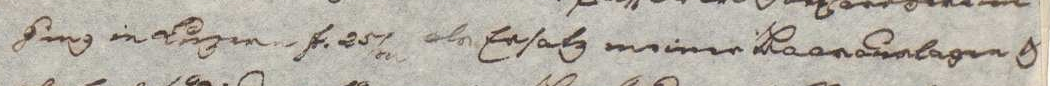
gung in Luzern fr. 25/m als Ersatz meiner Baarauslagen &
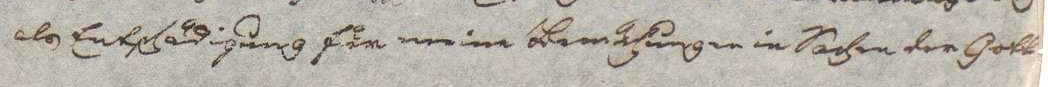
als Entschädigung für meine Bemühungen in Sachen der Gott-
